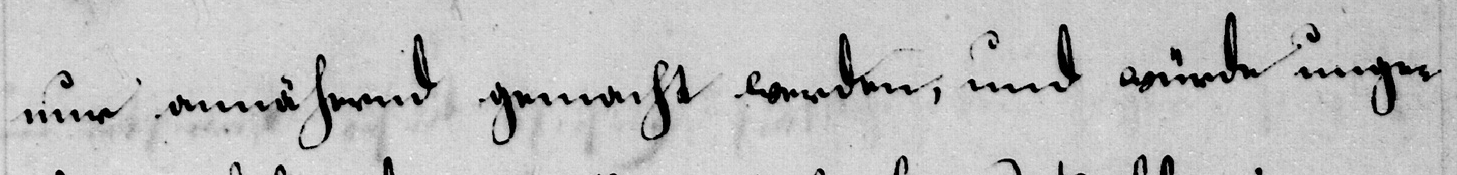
nur annähernd gemacht werden, und würde unge¬
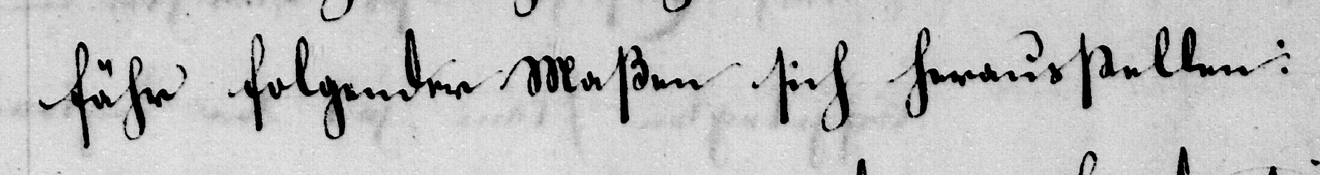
fähr folgender Maßen sich herausstellen:
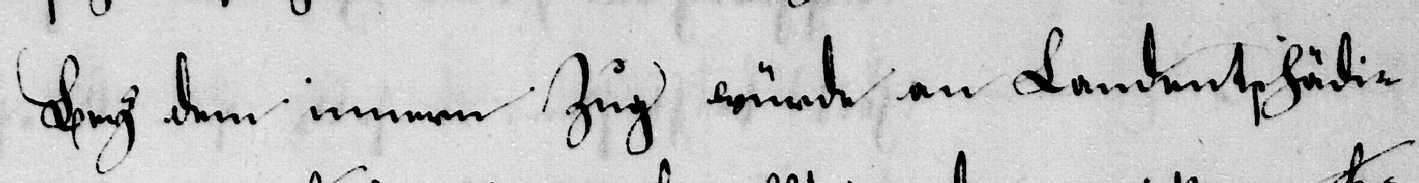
Bey dem innern Zug würde an Landentschädi¬
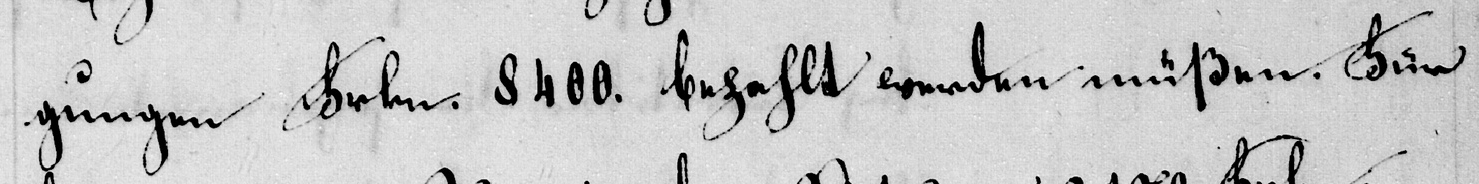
gungen Frkn. 8400. bezahlt werden müßen. Für
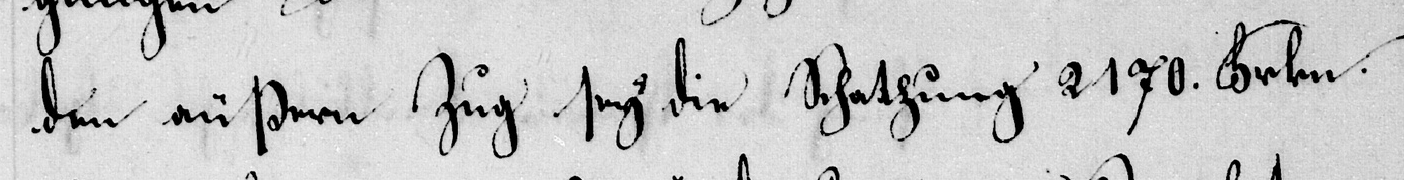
den äußern Zug sey die Schatzung 2170. Frkn.
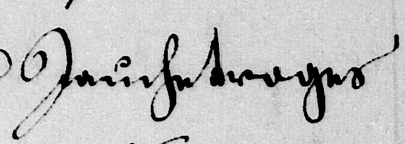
________
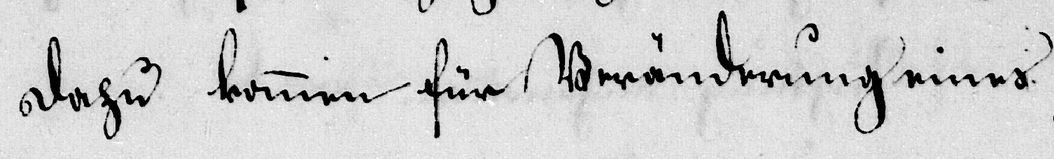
Dazu kommen für Veränderung eines
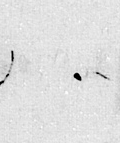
in¬
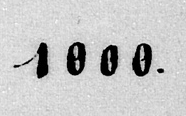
1000.
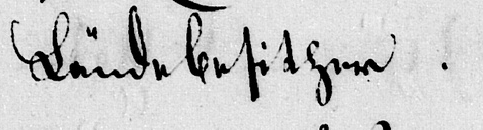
Ländebesitze¬
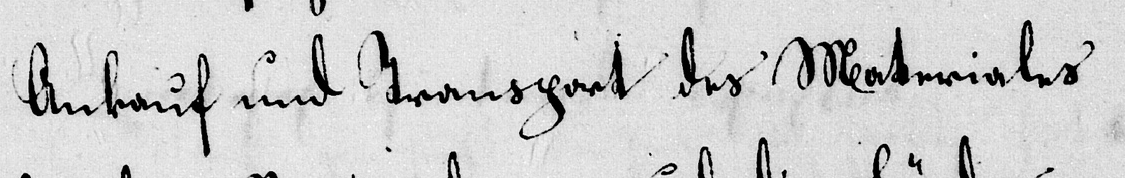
Ankauf und Transport des Materiales
